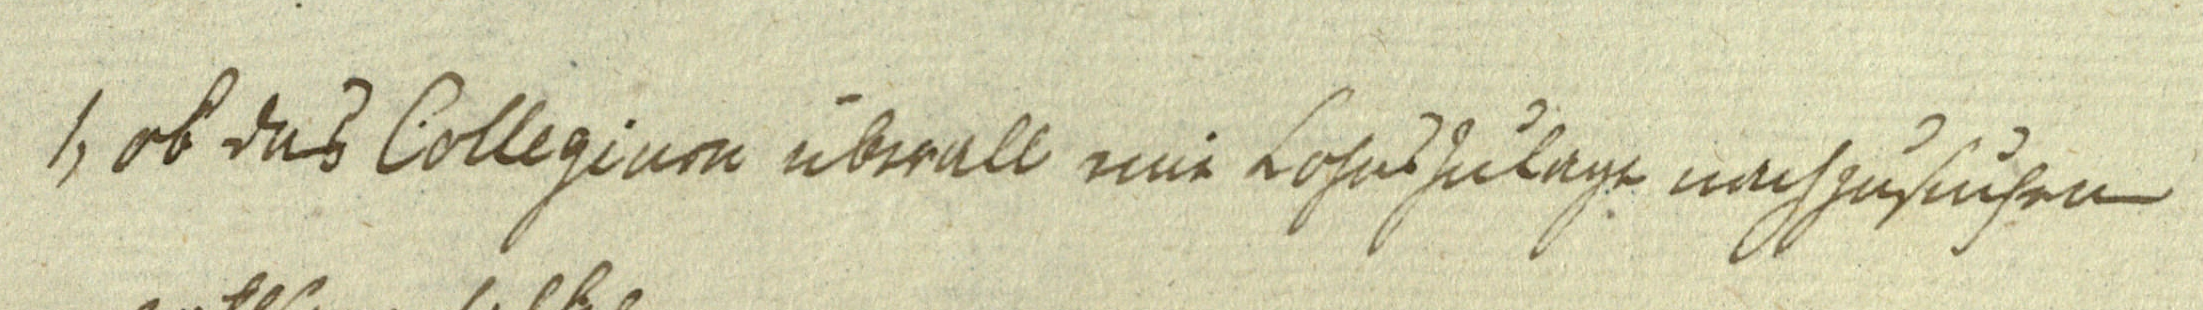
1, ob das Collegium überall eine Lohnszulage nachzusuchen
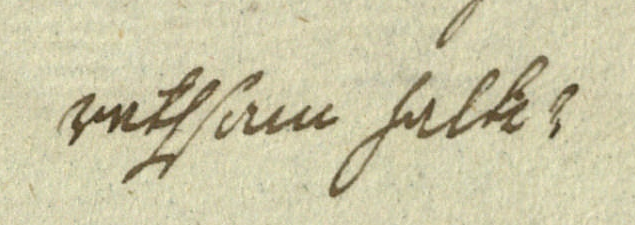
rathsam halte?
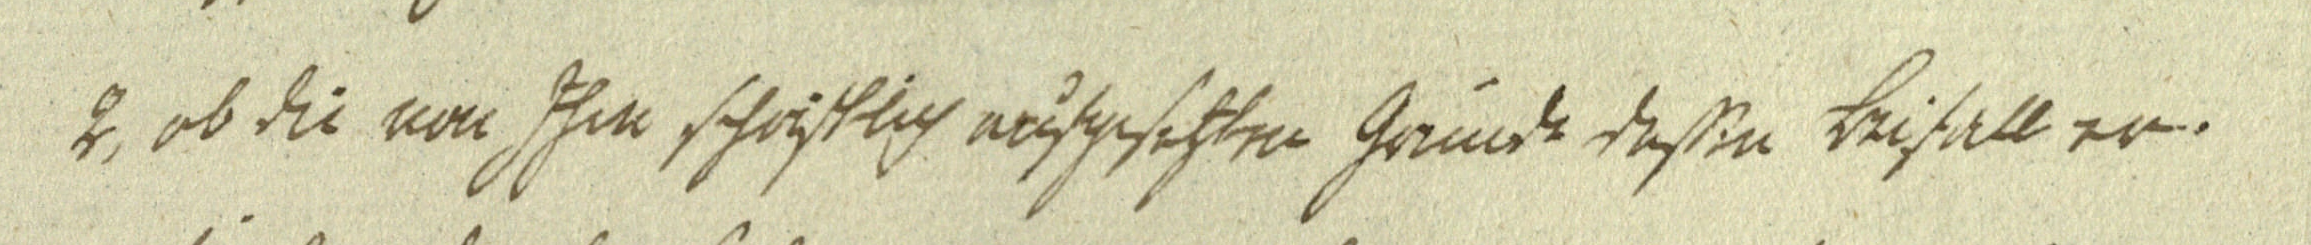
2, ob die von Ihm schriftlich aufgesetzten Gründe dessen Beifall er¬
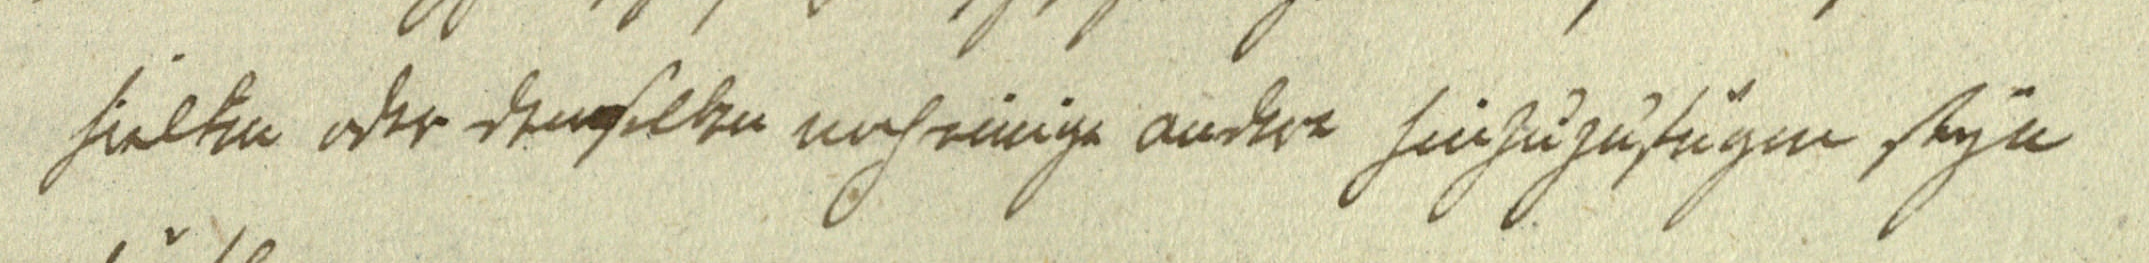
hielten oder demselben noch einige andere hinzuzufügen seÿn
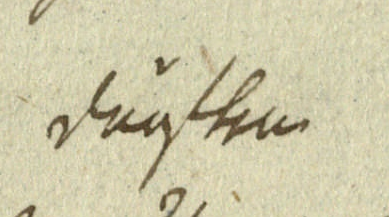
dürften
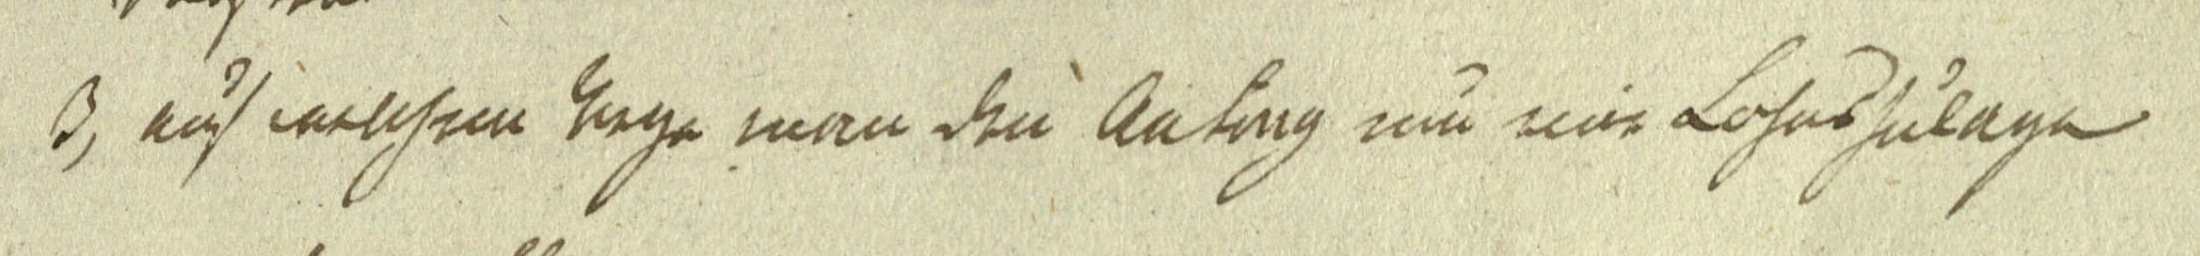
3, auf welchem Wege man den Antrag um eine Lohnszulage
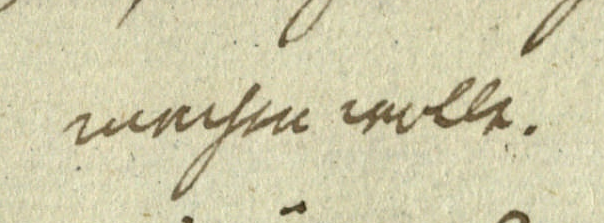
machen wolle.
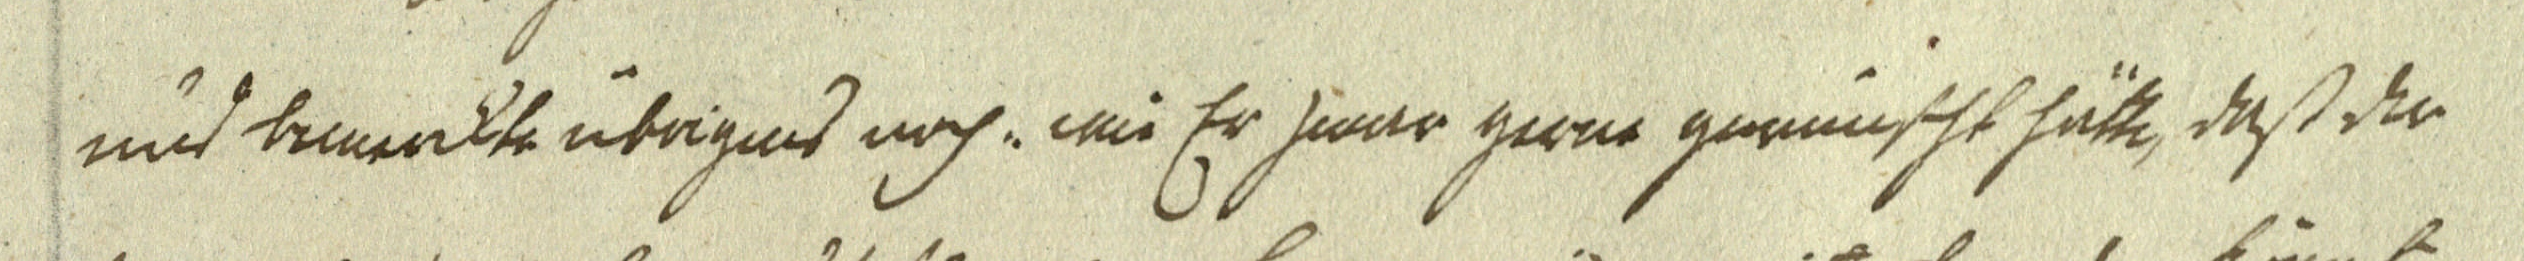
und bemerkte übrigens noch: wie Er zwar gerne gewünscht hätte, daß der
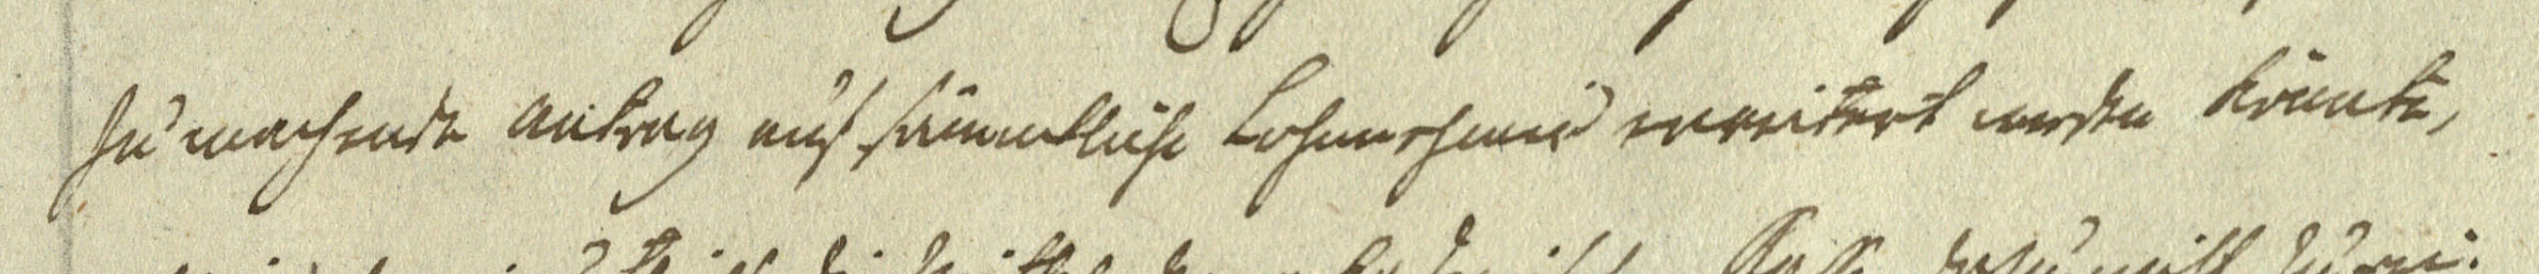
zu machende Antrag auf sämmtliche Lohnnehmer erweitert werden könnte,
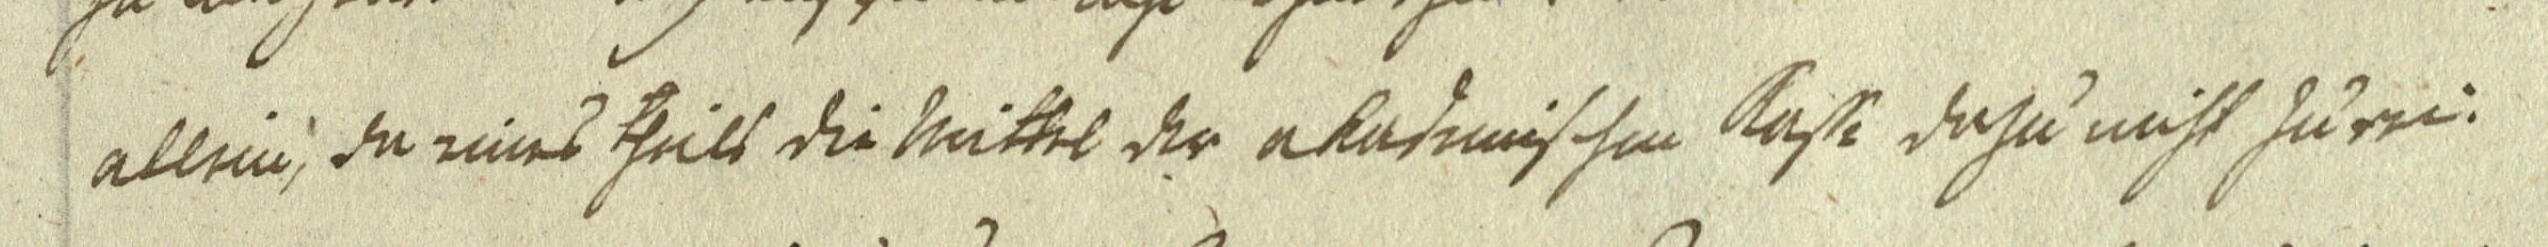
allein, da eines theils die Mittel der akademischen Kasse dazu nicht zurei¬
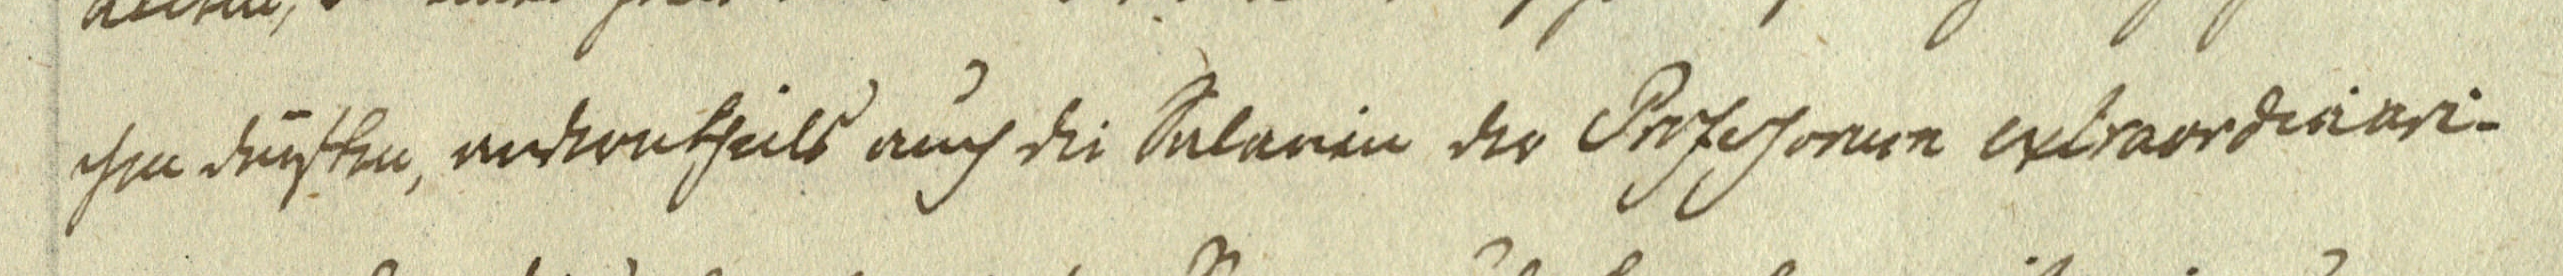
chen dürften, anderntheils auch die Salarien der Professorum extraordinari¬
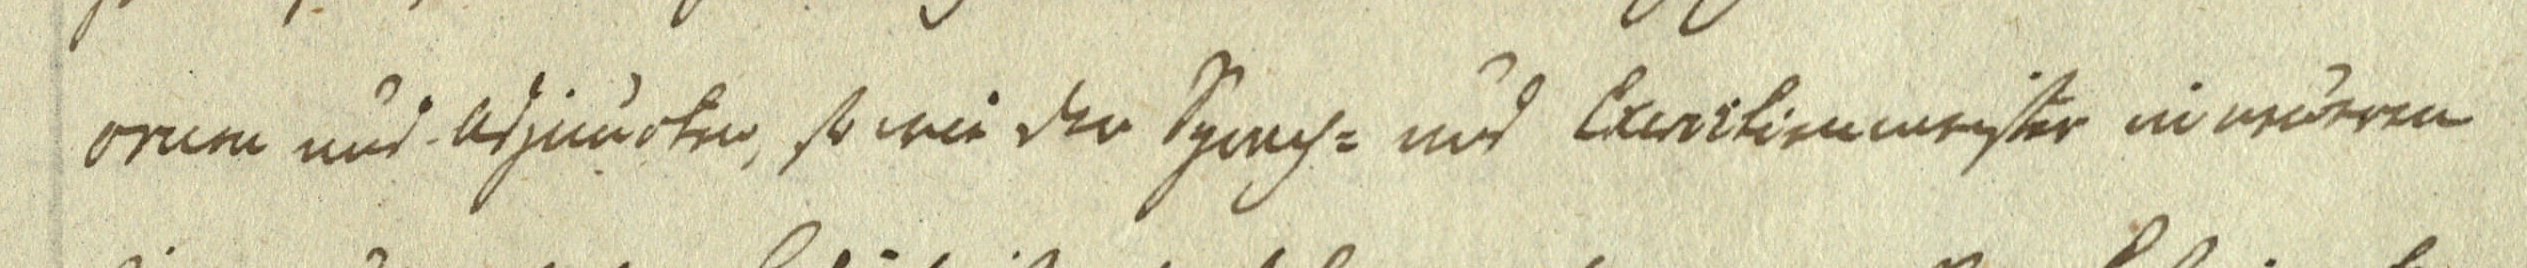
orum und Adjuncten, so wie der Sprach- und Exercitienmeister in neueren
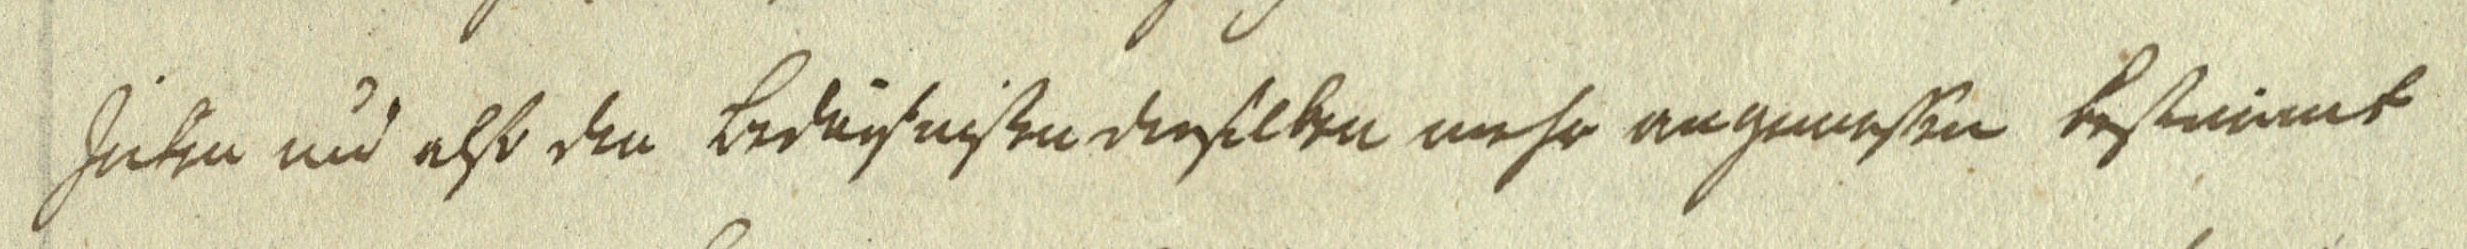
Zeiten und also den Bedürfnissen derselben mehr angemessen bestimmt
